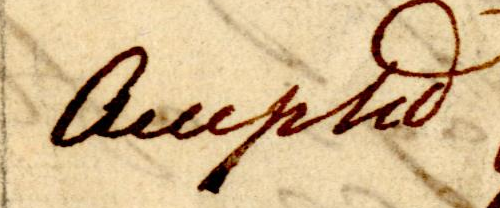Accepted
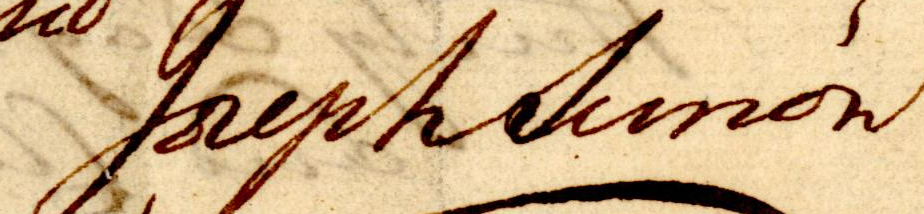Joseph Simon
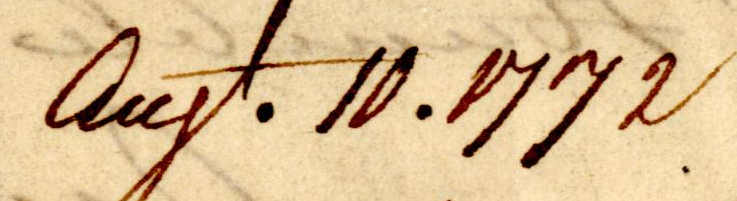Aug^t. 10. 1772
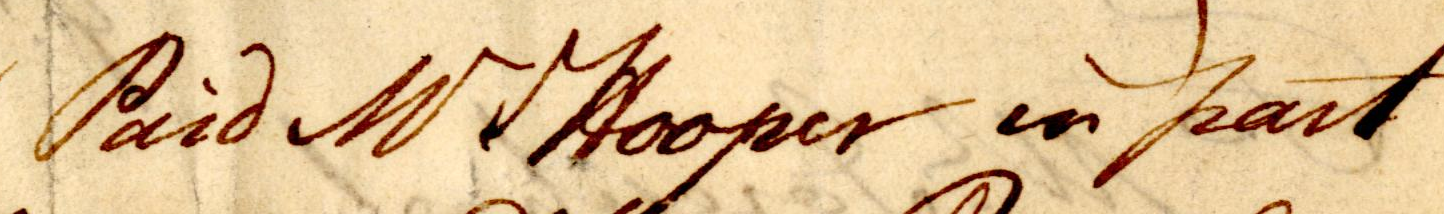Paid M^r Hooper in part
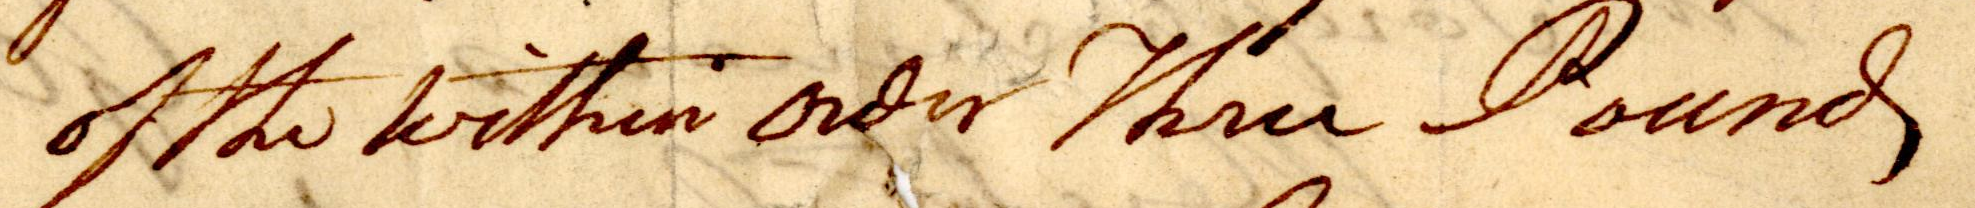of the within order three Pounds
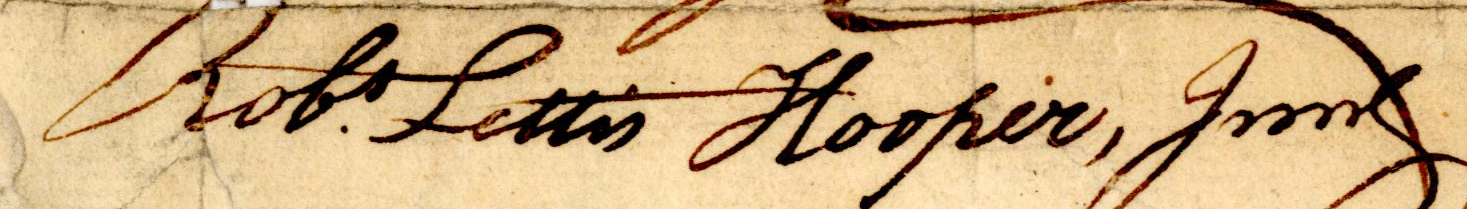Rob. Letters Hooper, QMG
